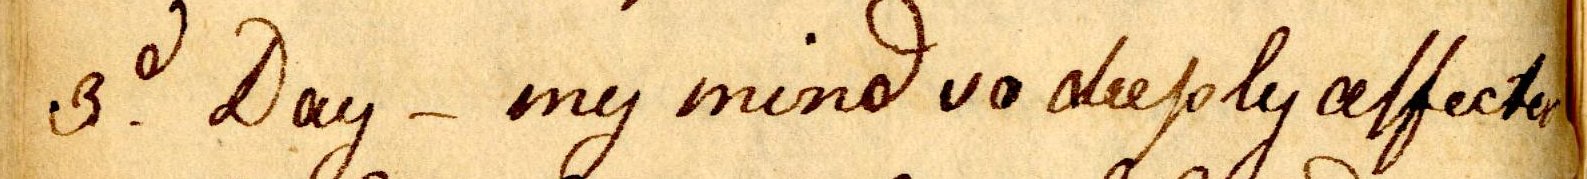3^d. Day - my mind so deeply affected
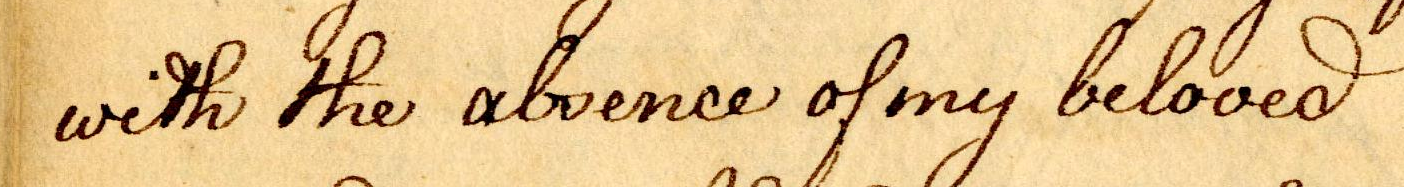with the absence of my beloved
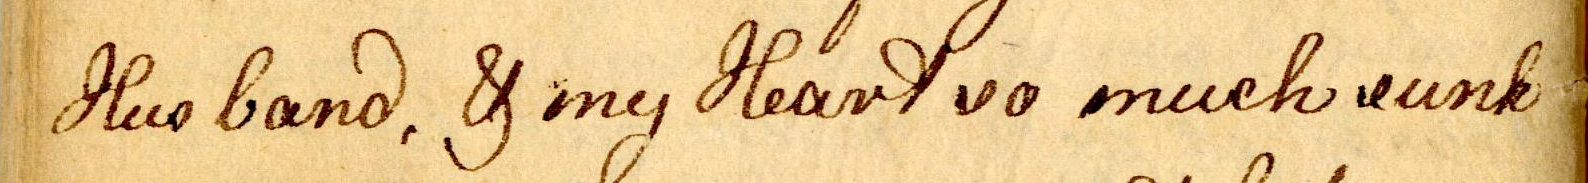Husband, & my Heart so much sunk
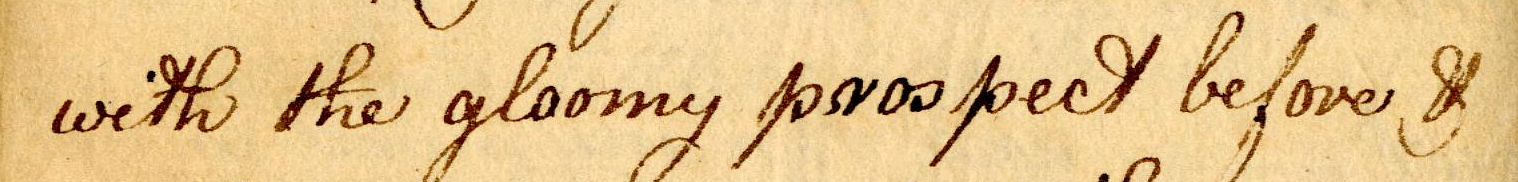with the gloomy prospect before &
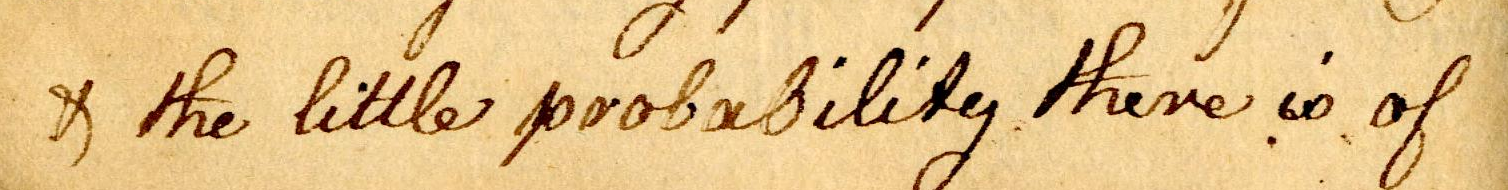& the little probability there is of
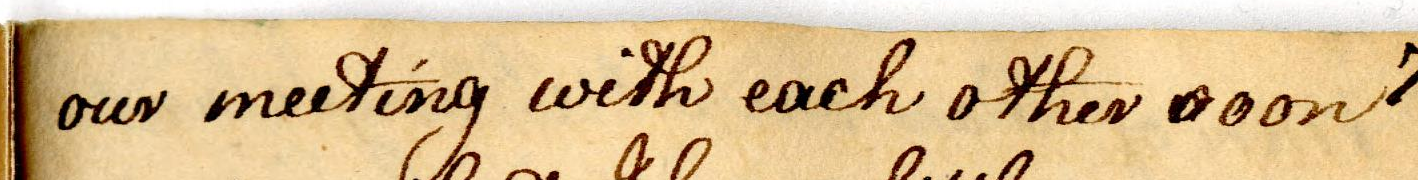our meeting with each other soon
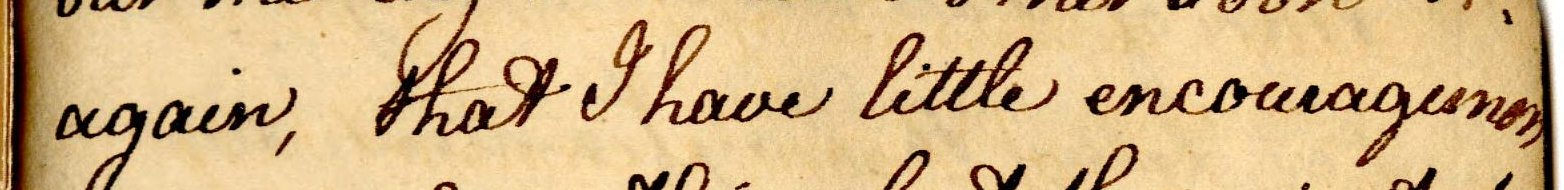again, that I have little encouragemen
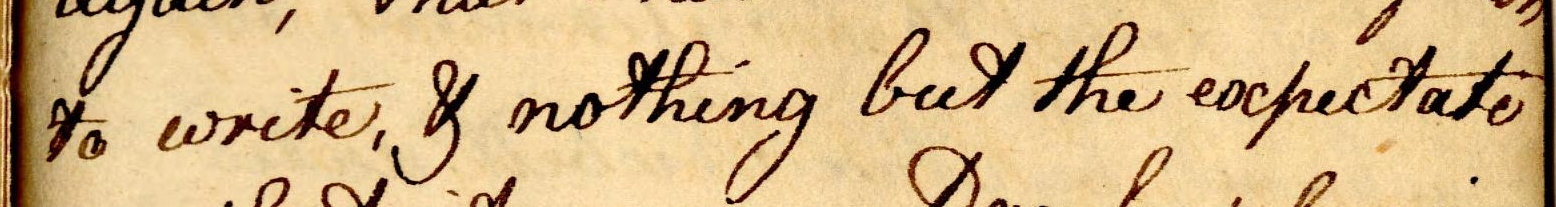to write, & nothing but the expectati
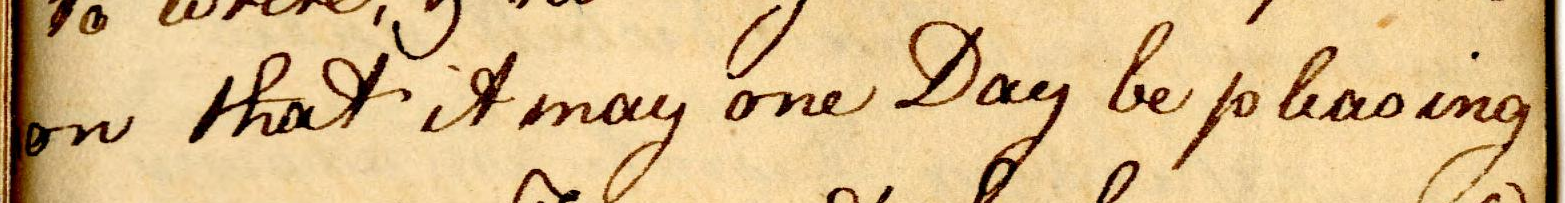on that it may one Day be pleasing
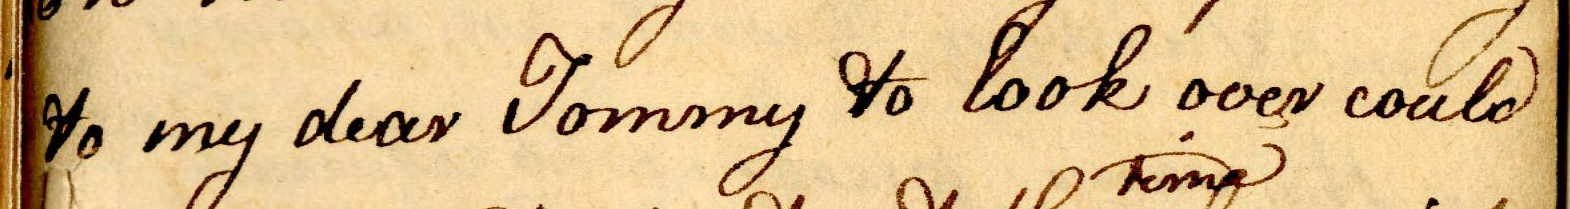to my dear Tommy to look over could
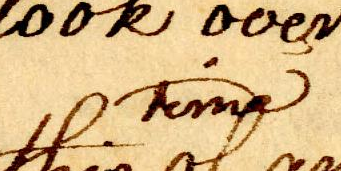time
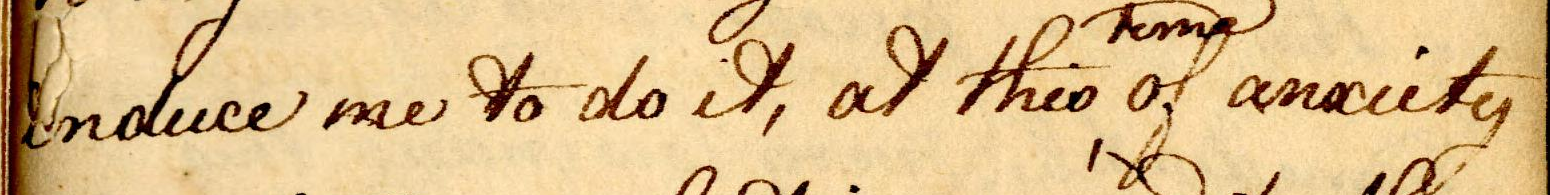Induce me to do it, at this ^ of anxiety
